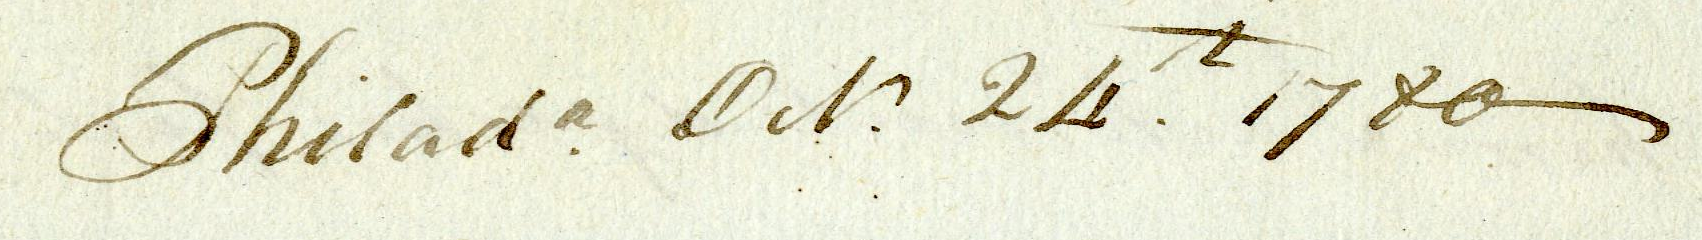Philad^a. Oct. 24^t. 1780
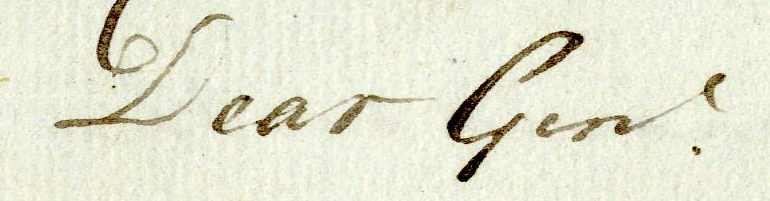Dear Gen^l.
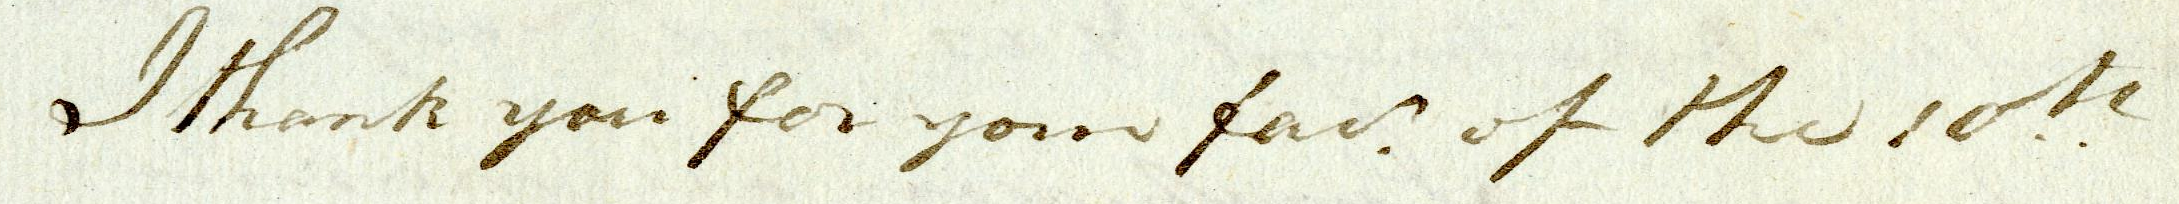I thank you for your fav^r. of the 10^th
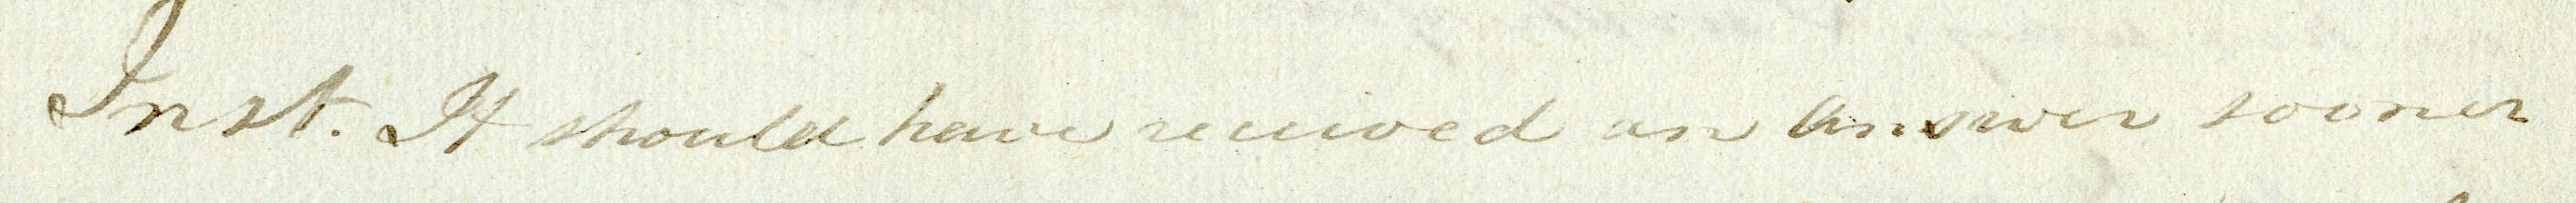Inst. It should have received an answer sooner
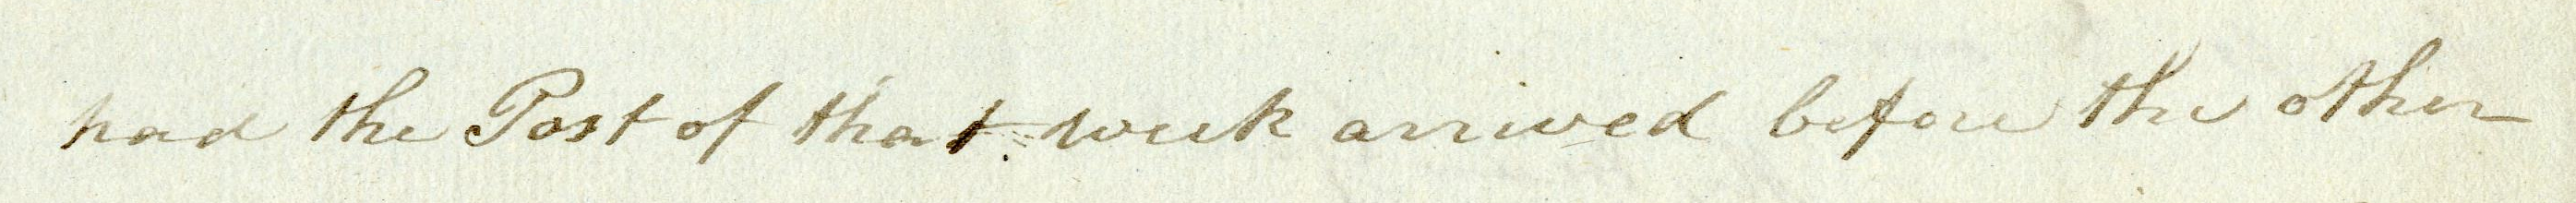had the Post of that week arrived before the other
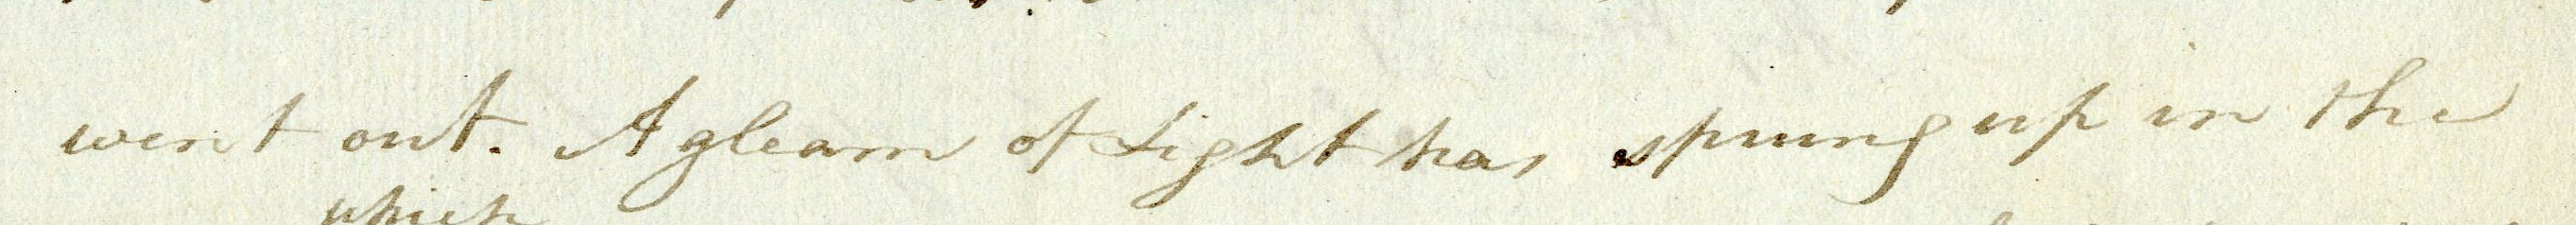went out. A gleam of Light has sprung up in the
